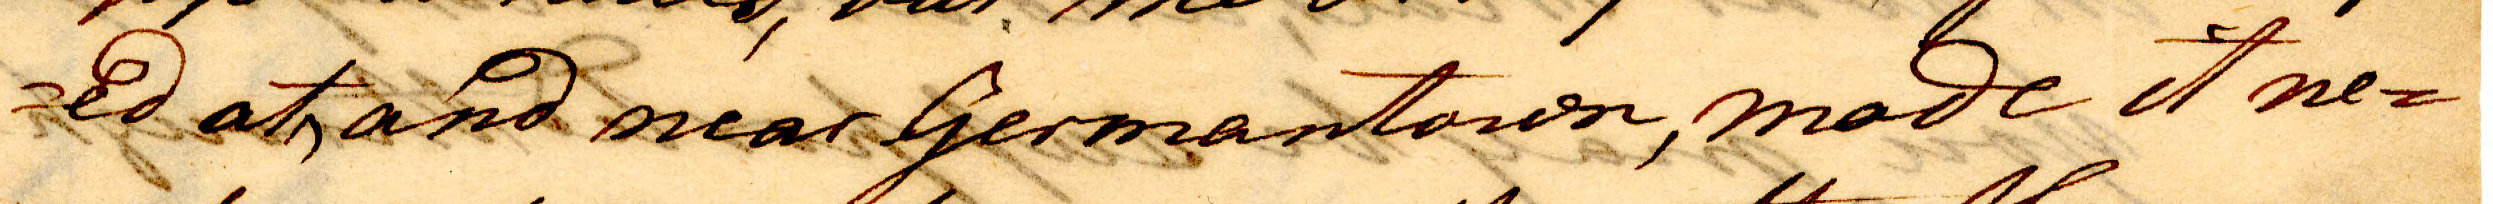-ed at, and near Germantown, made it ne-
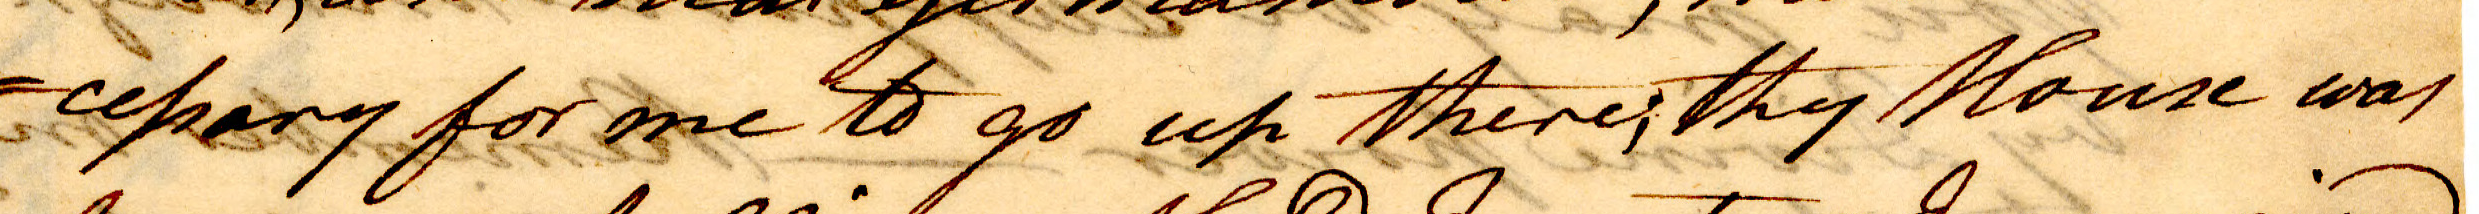-cessary for me to go up there; thy House was
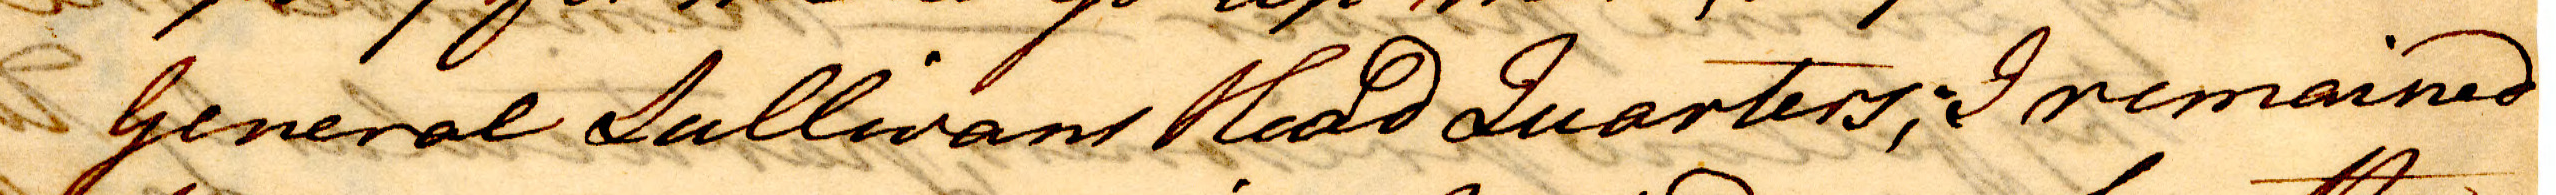General Sullivans Head Quarters; I remained
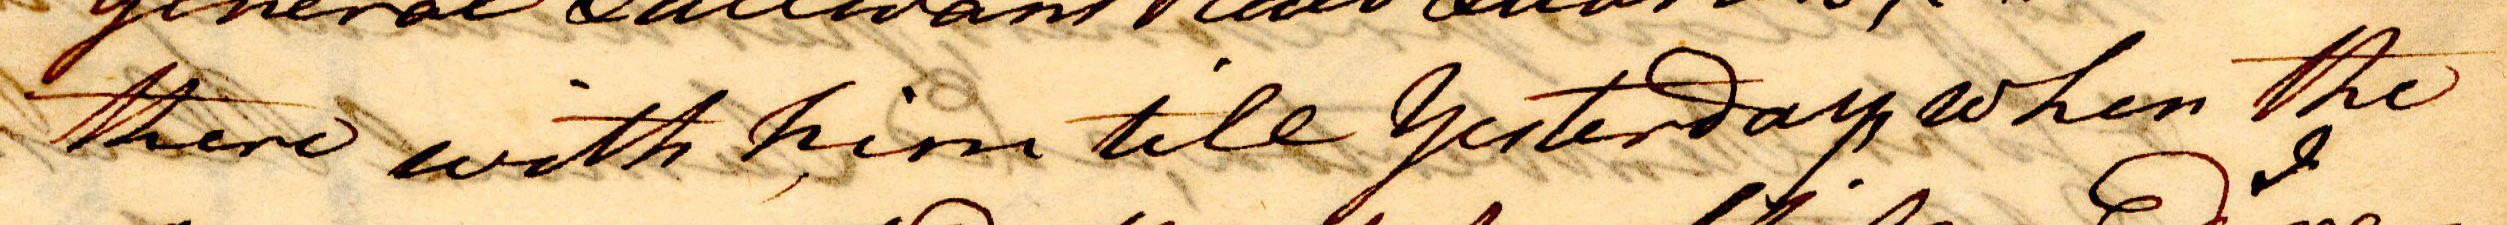there with him till Yesterday, when the
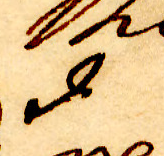I
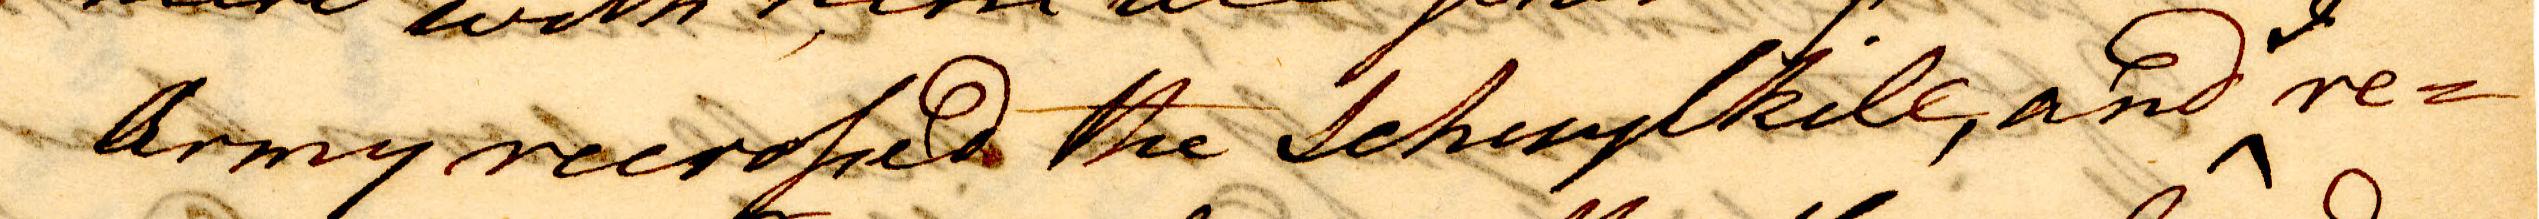Army recrossed the Schuylkill, and ^ re-
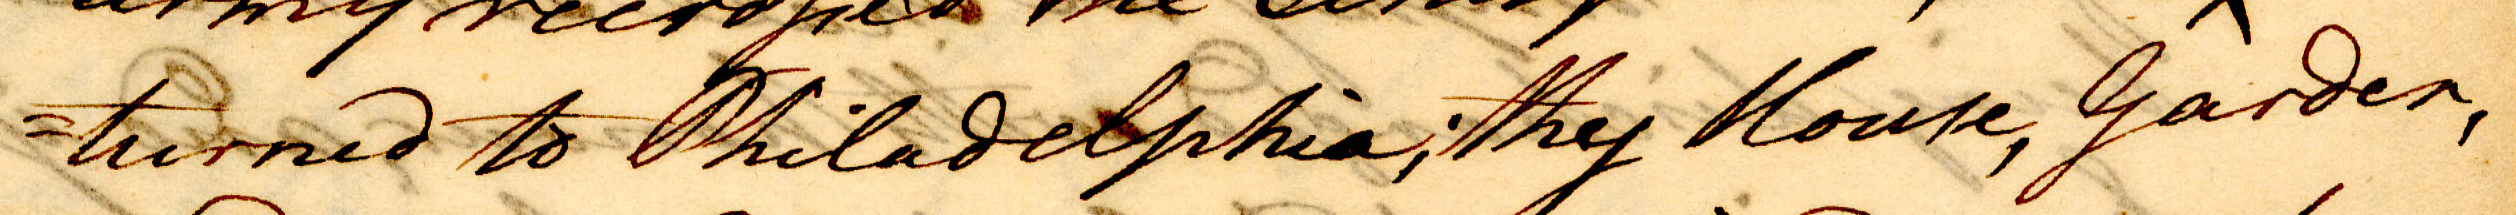-turned to Philadelphia; thy House, Garden,
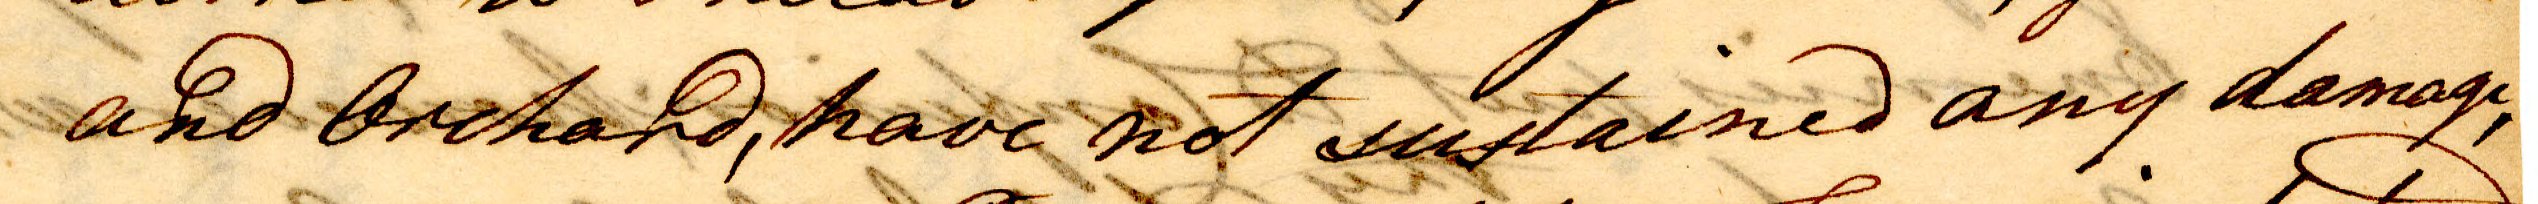and Orchard, have not sustained any damage,
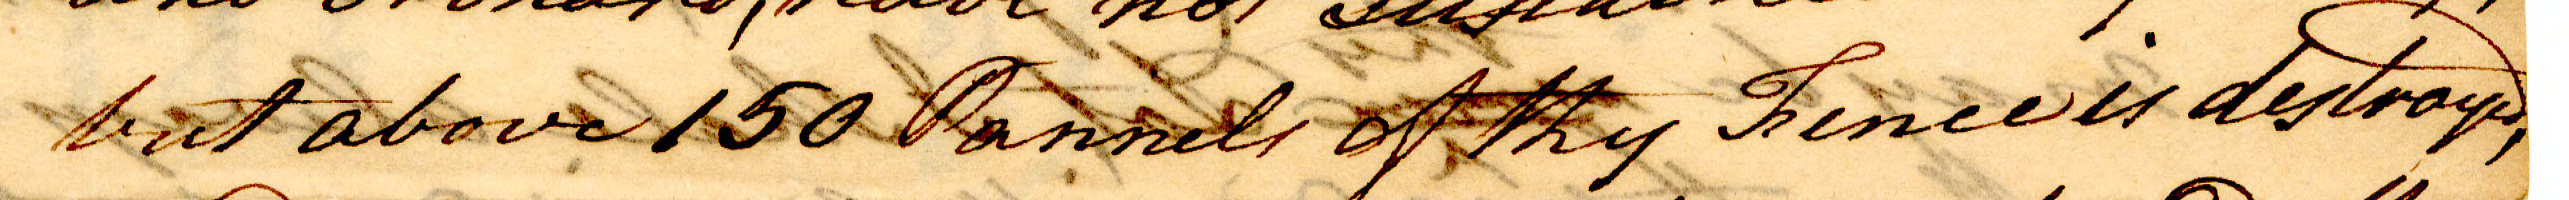but above 150 Pannels of thy Fence is destroyd,
